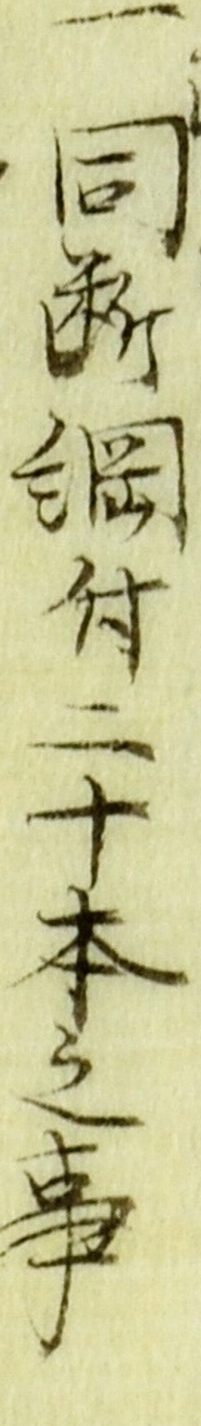一同断綱付二十本之事
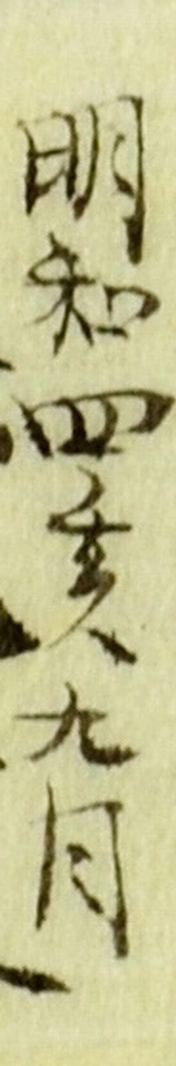明和四亥九月
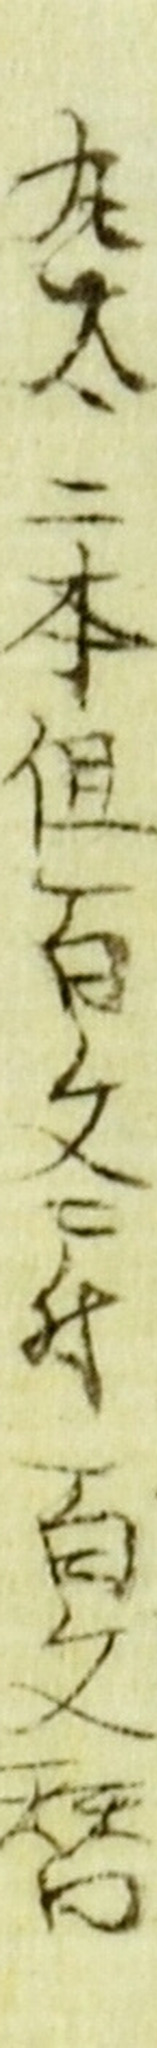丸太二本但百文ニ付百文替
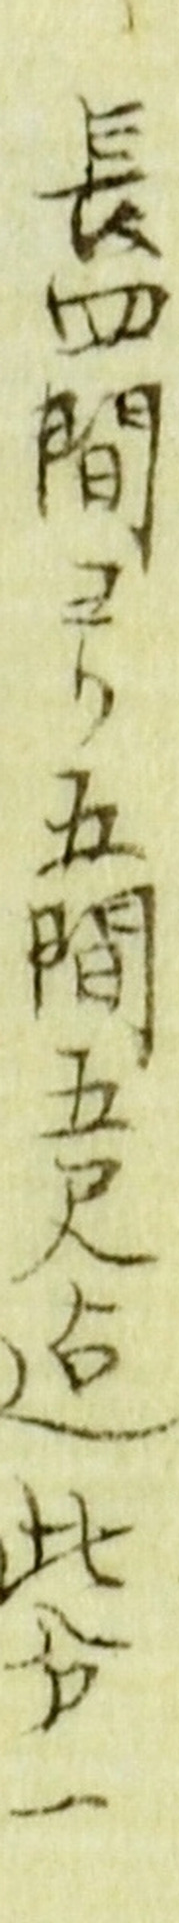長四間ヨリ五間五尺迄此分一
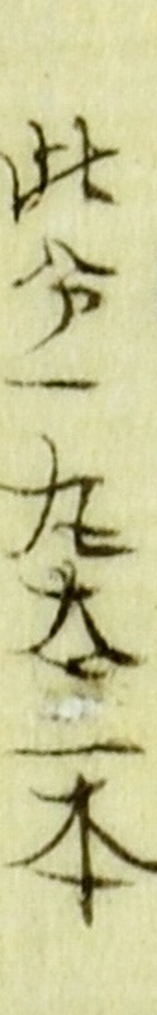此分一丸太一本
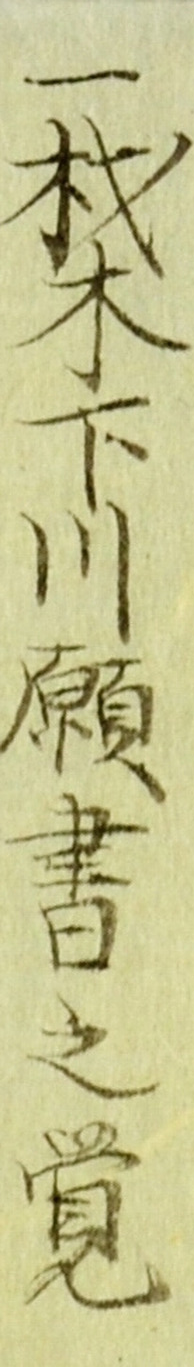一材木下川願書之覚
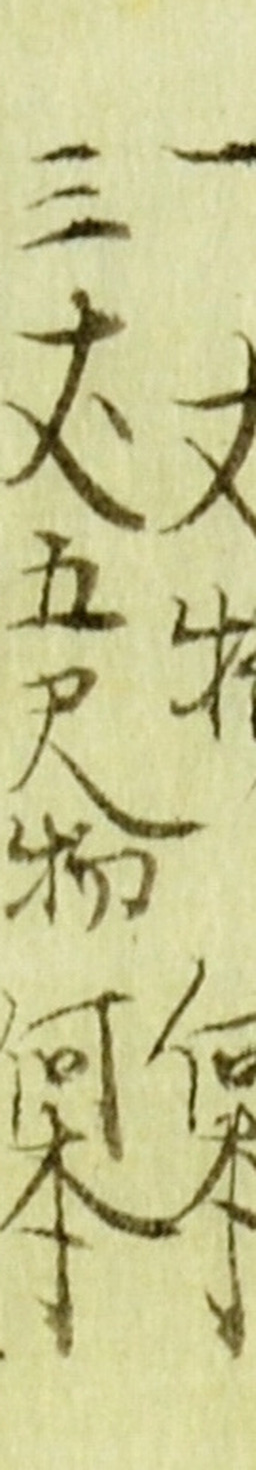三丈五尺物何本
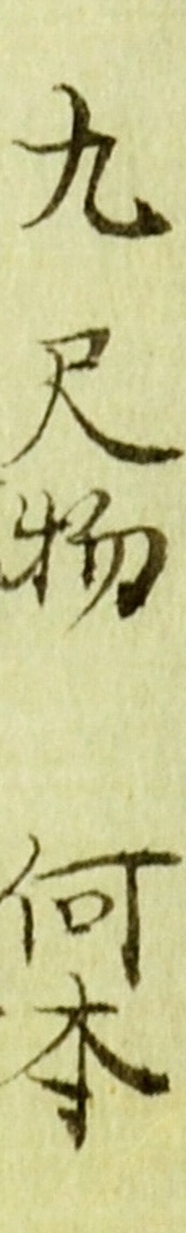九尺物何本
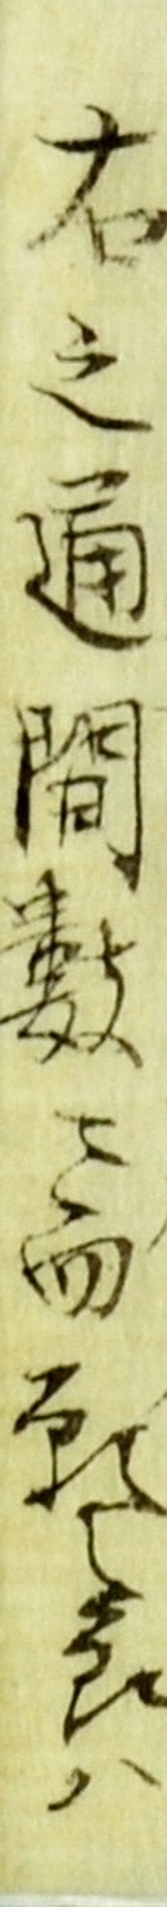右之通間数ニ而願之節ハ

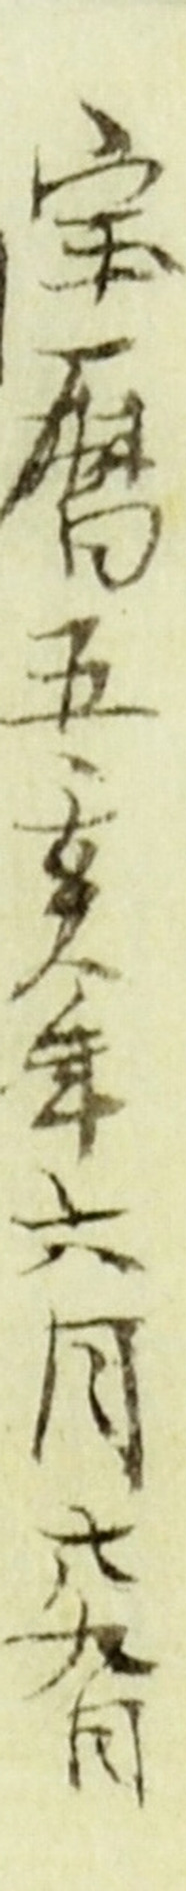宝暦五亥年六月廿九日
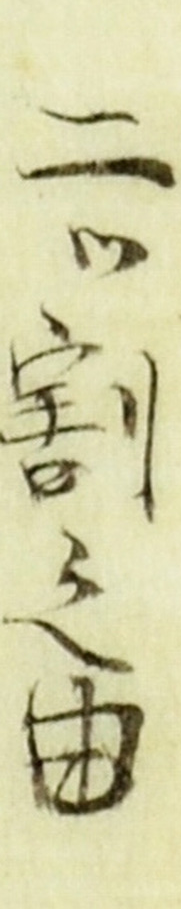二ツ割之由
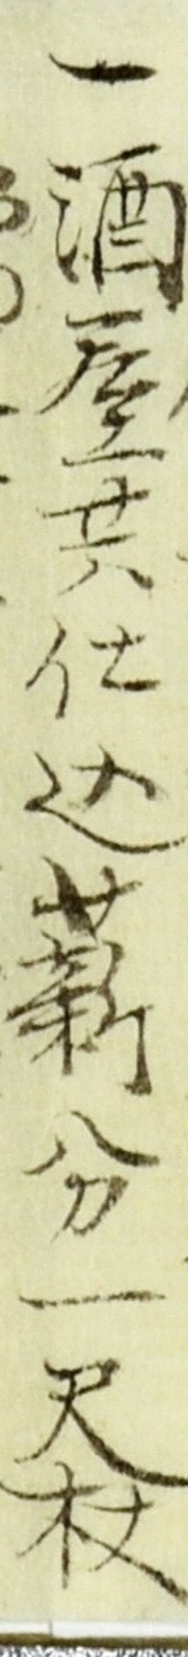一酒屋共仕込薪分一尺杖
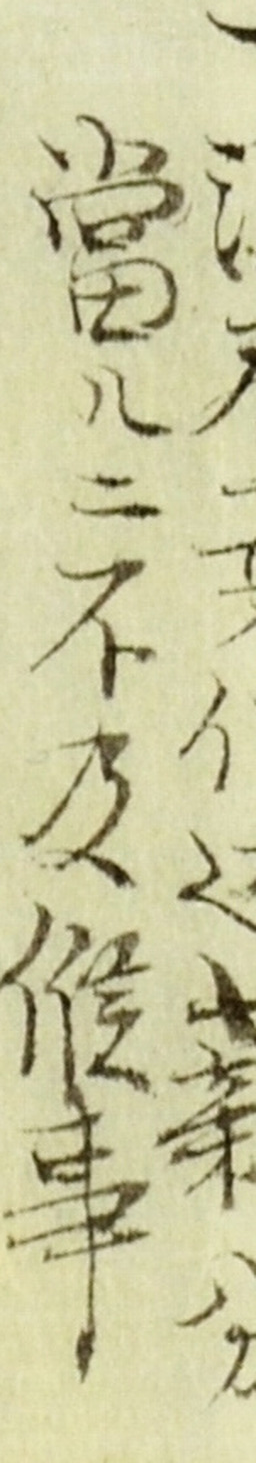当ルニ付及候事
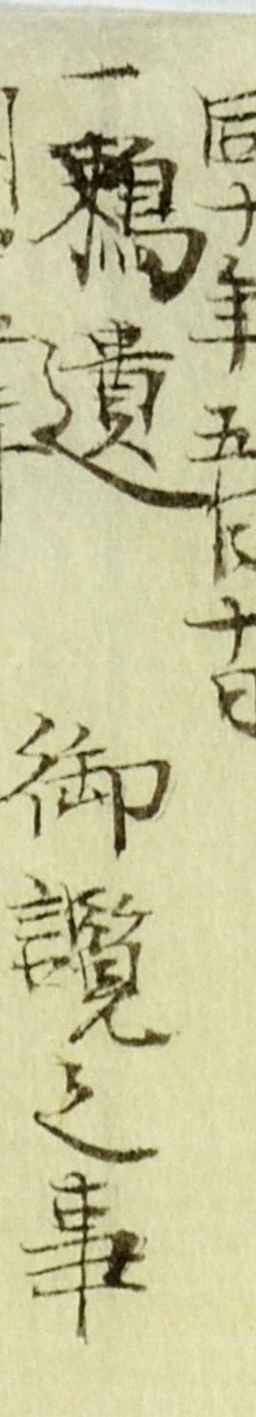一鵣遺御之事
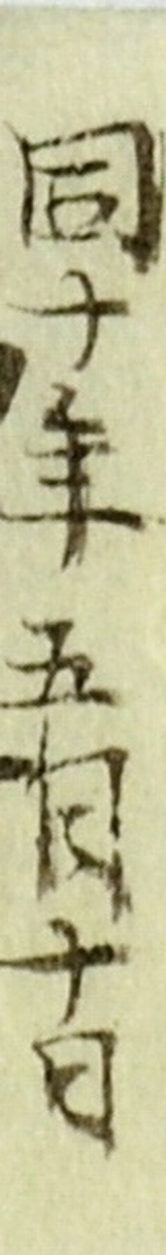同十年五月十日
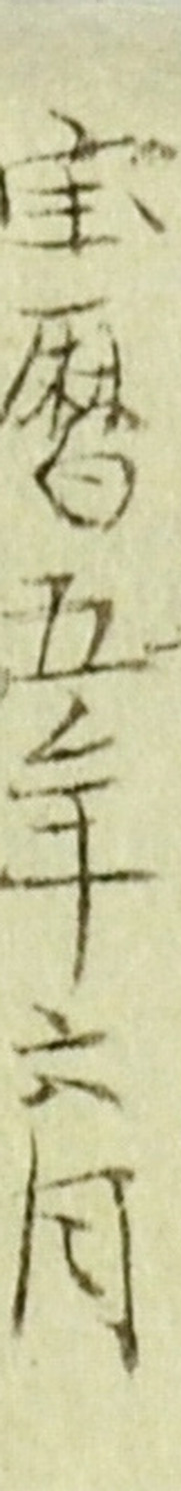宝暦五年六月
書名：分一御定法
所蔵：伊那市立高遠町図書館・合同会社AMANE
